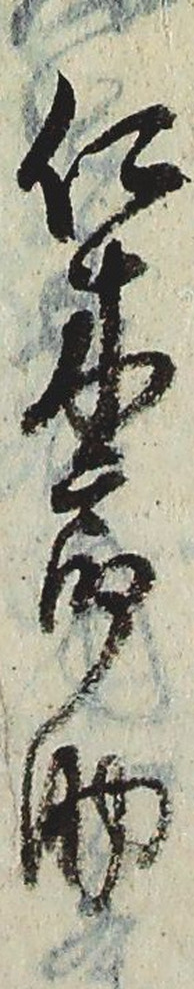仁木節助
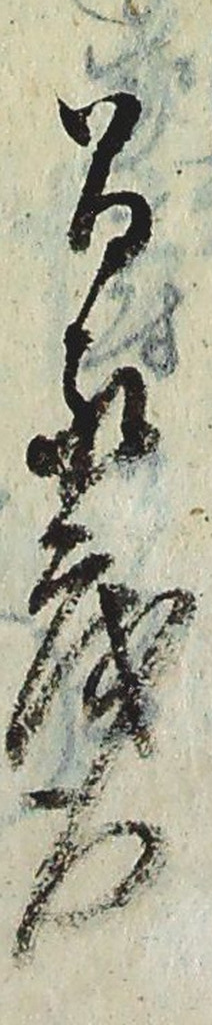富永茂右衛門
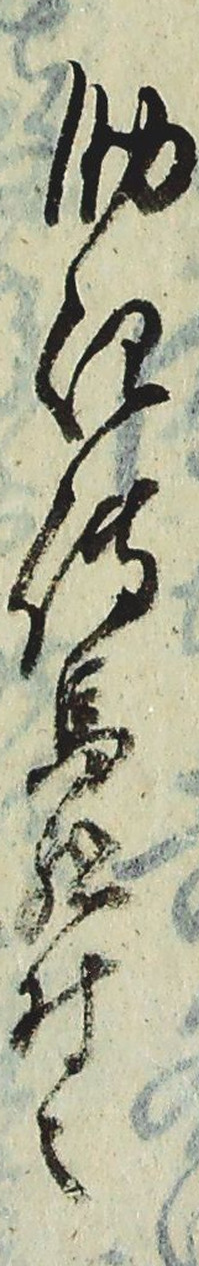助任伝馬組村々
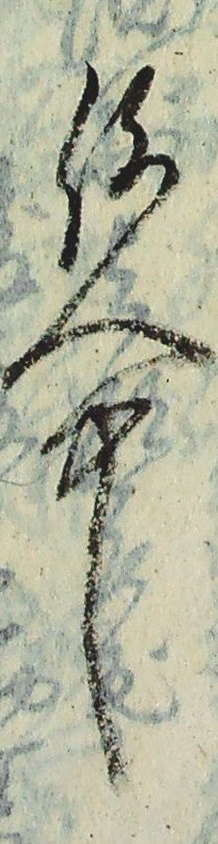役人中

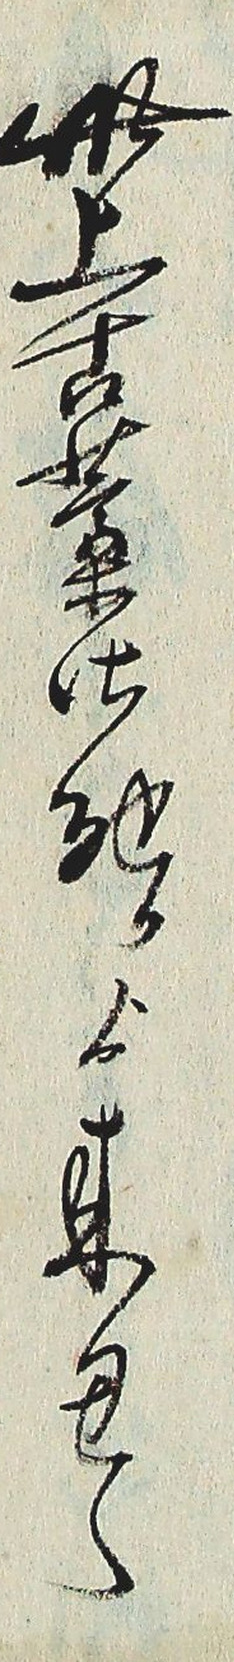此上古藁仕配りゟ来丑へ
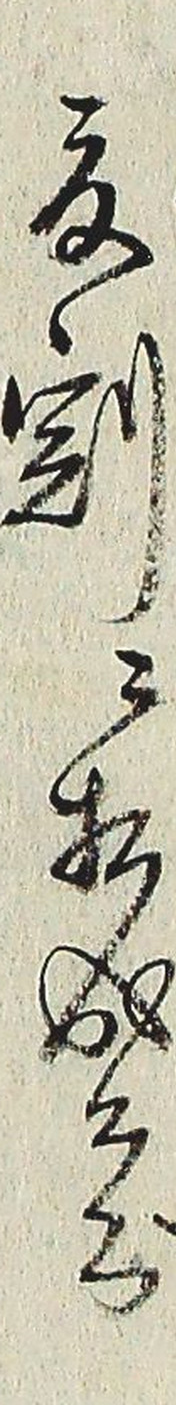夏割に相成候分

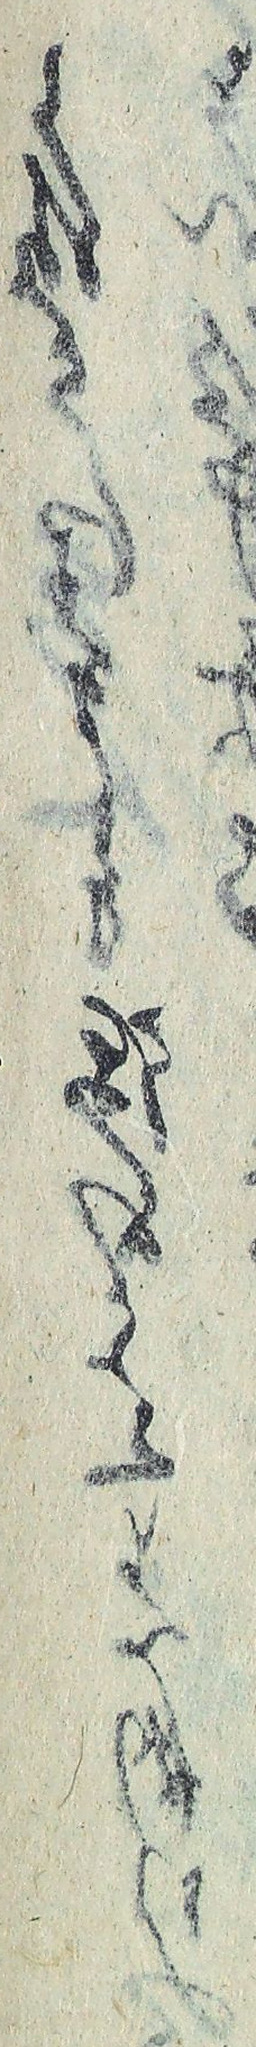子十一月十七日
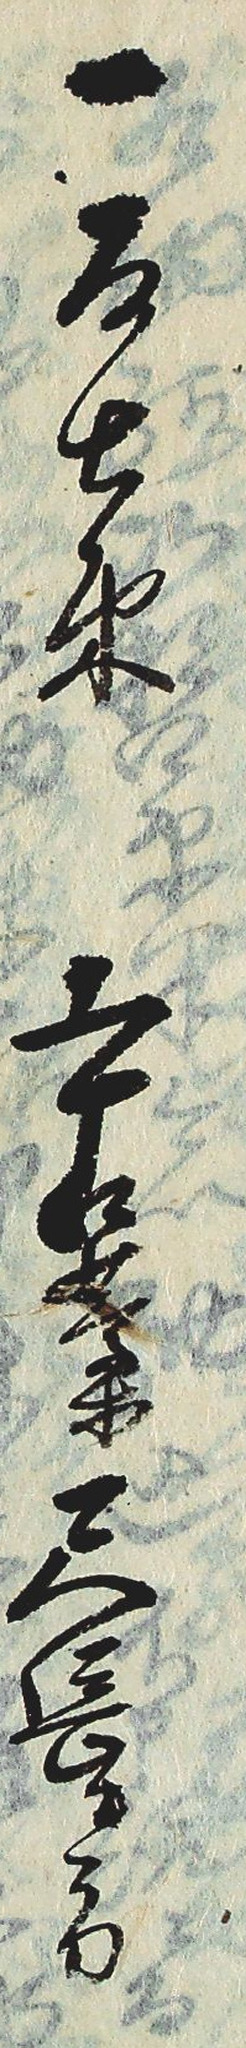一百七束上古藁尺長き方
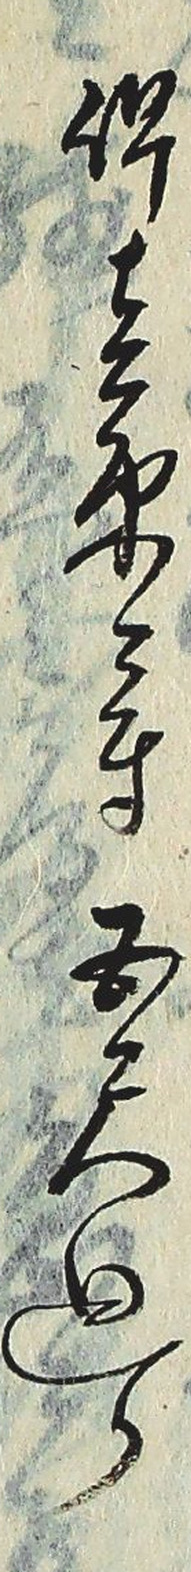但し壱束に付五尺廻り
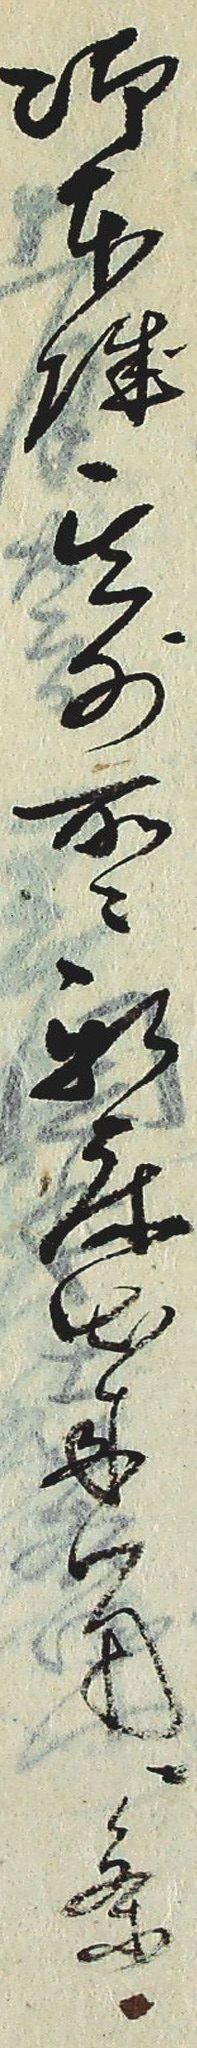御本城其外所々新床出来御用候条
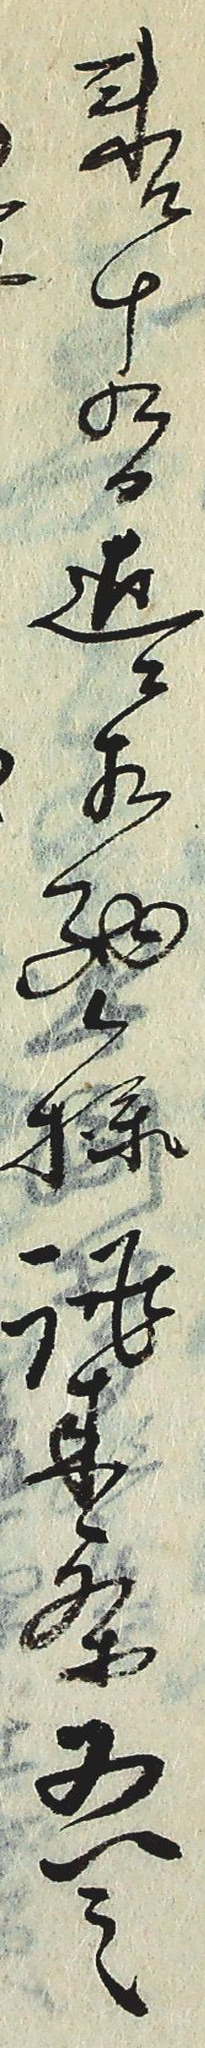来る十九日迄に相納候様誂来候条右之
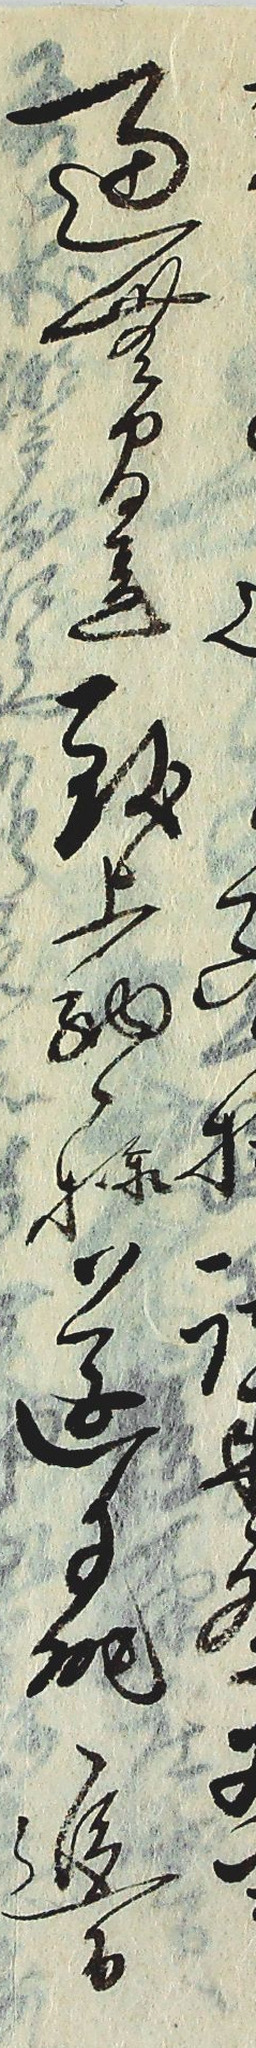通無間違致上納候様遂手配追て
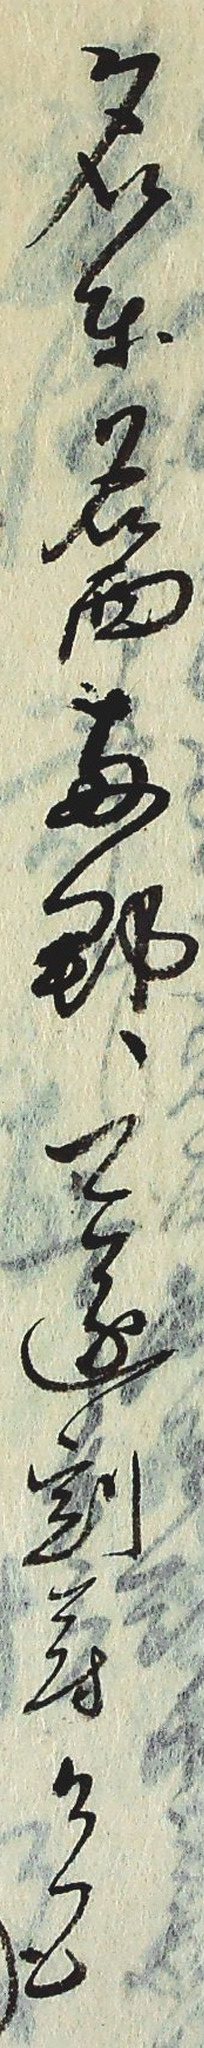名東名西両郡へ可遂割苻候以上
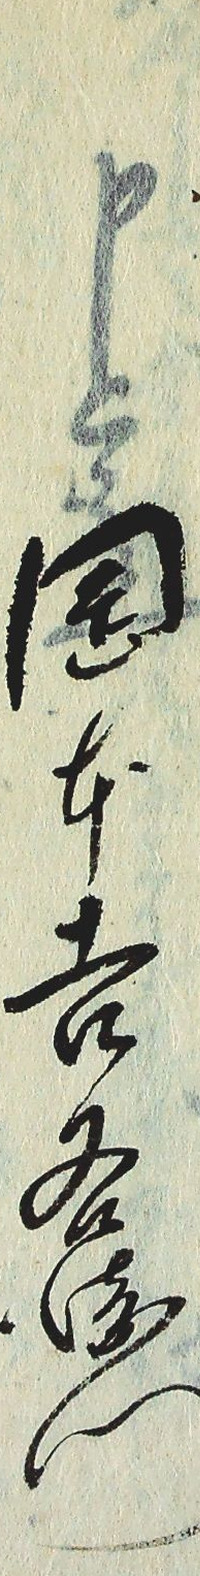岡本吉右衛門
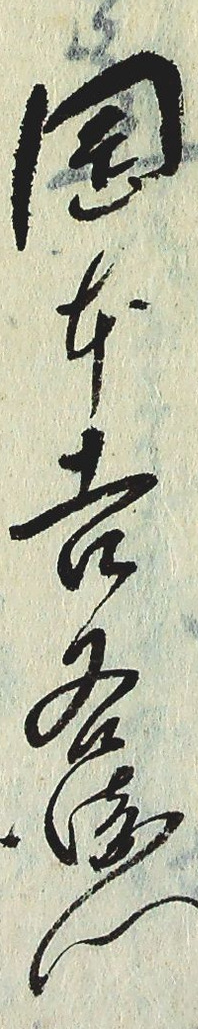岡本吉右衛門
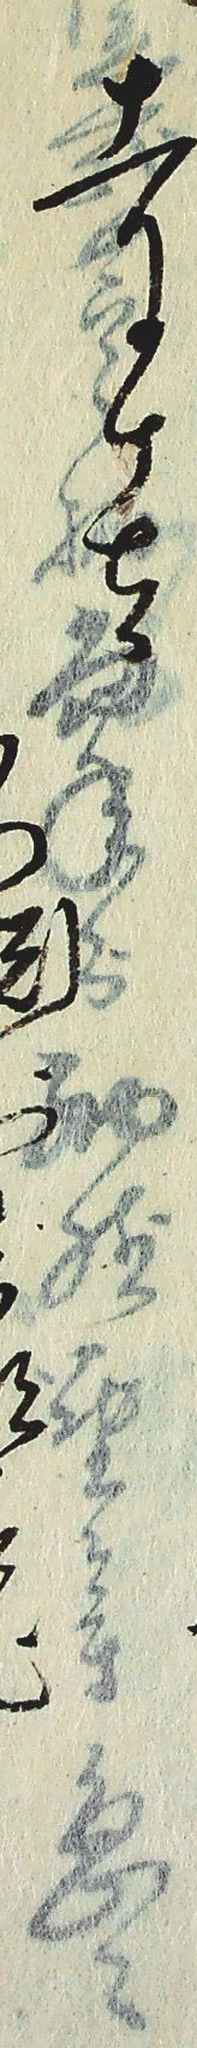子十一月十七日
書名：名東郡中諸割賦元帳
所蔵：鳴門教育大学 Naruto University of Education
